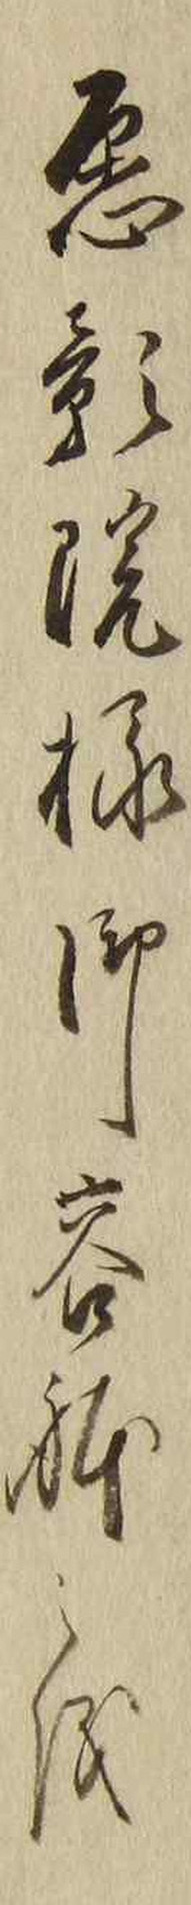愿彰院様御容躰之儀

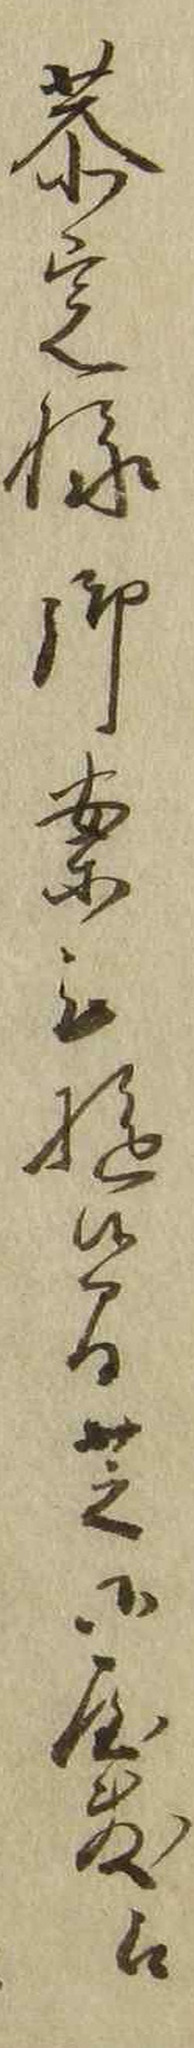恭定様御案被遊候間芝御屋敷江
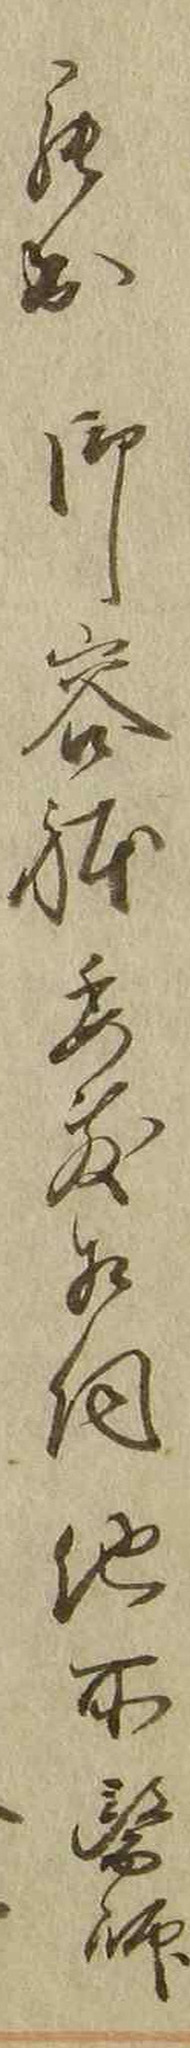罷出御容躰委敷相伺他所医師
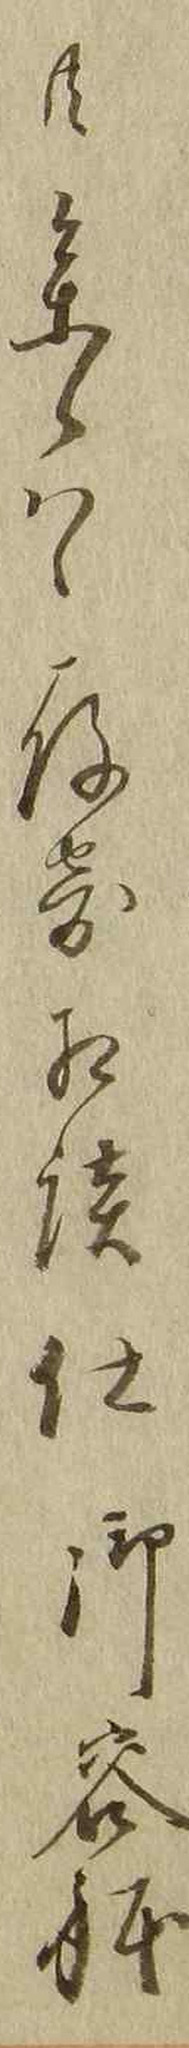共参候ハヽ存寄相談仕御容躰
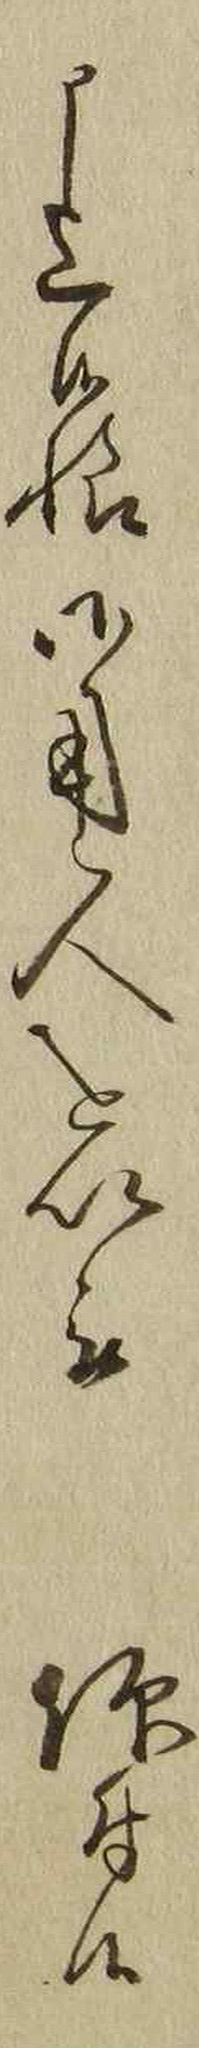申上候様御用人を以被仰付候
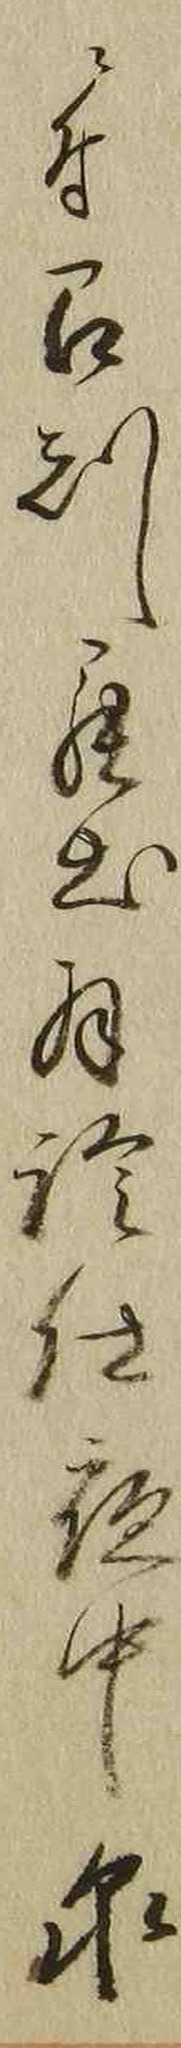ニ付即刻罷出拝診仕夜中泉
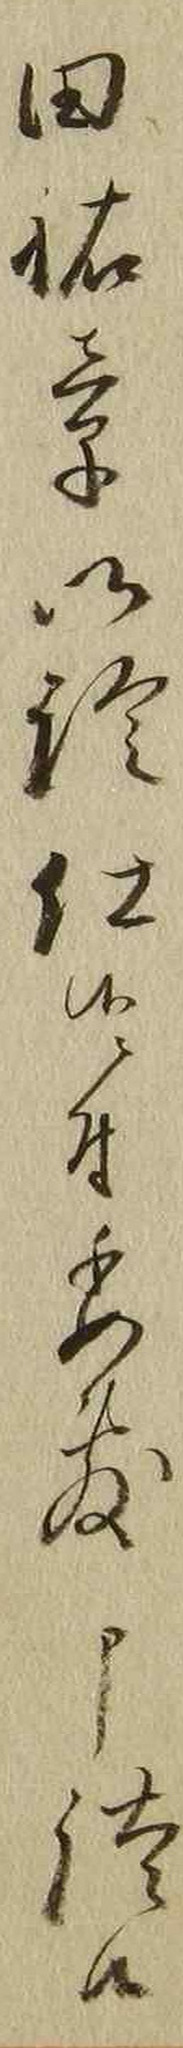田祐章御診仕候ニ付委敷申談候
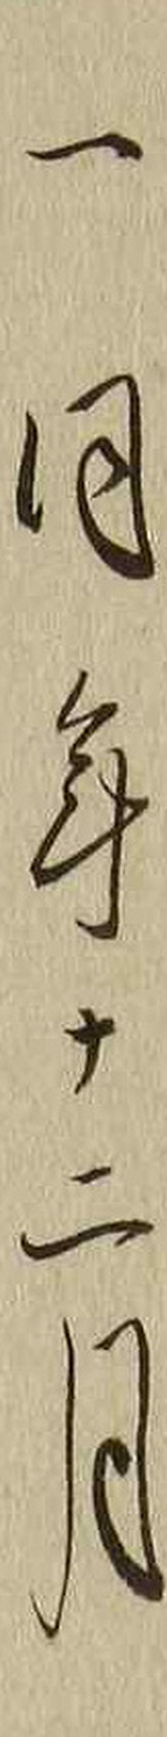一同年十二月
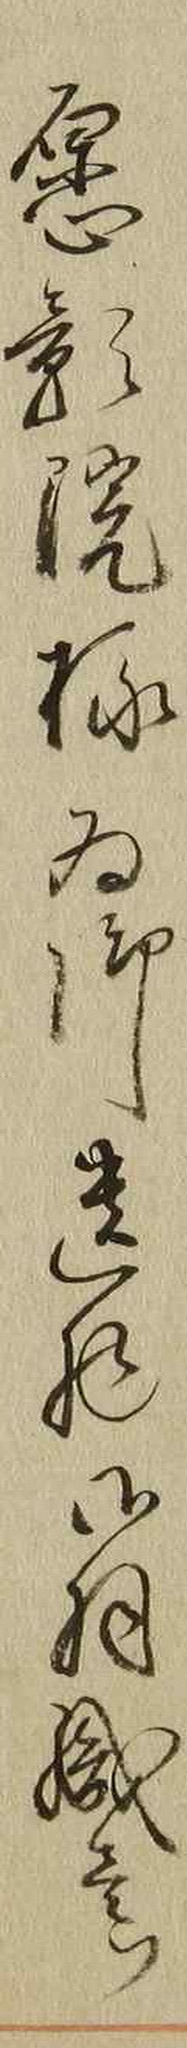愿彰院様為御遣物御羽織壱ツ
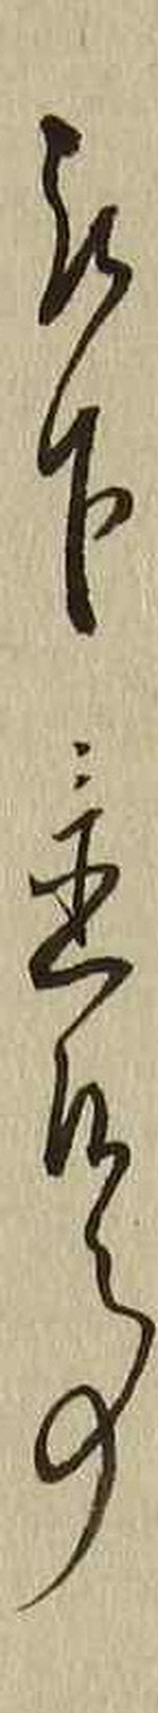被下置候事
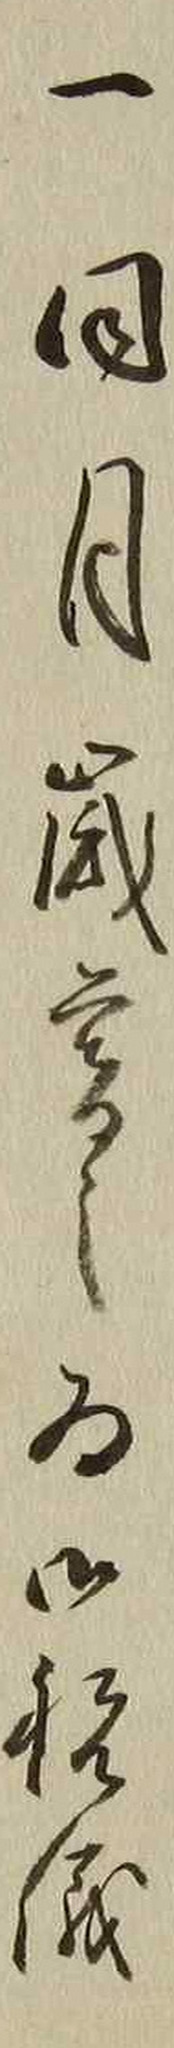一同月歳暮之為御祝儀
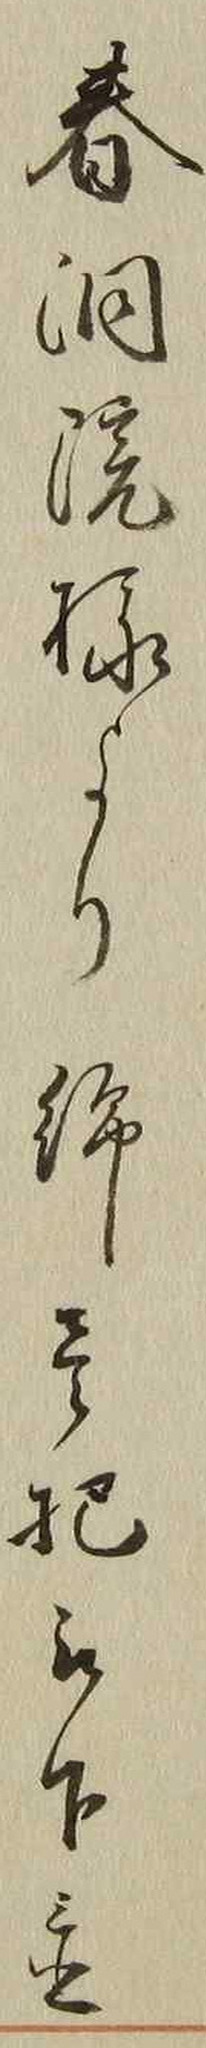春洞院様より綿壱把被下置
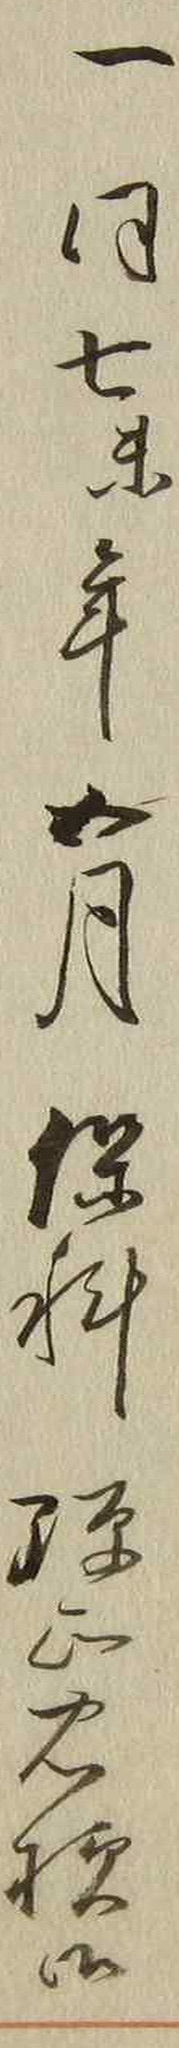一同七未年五月保科弾正忠様御
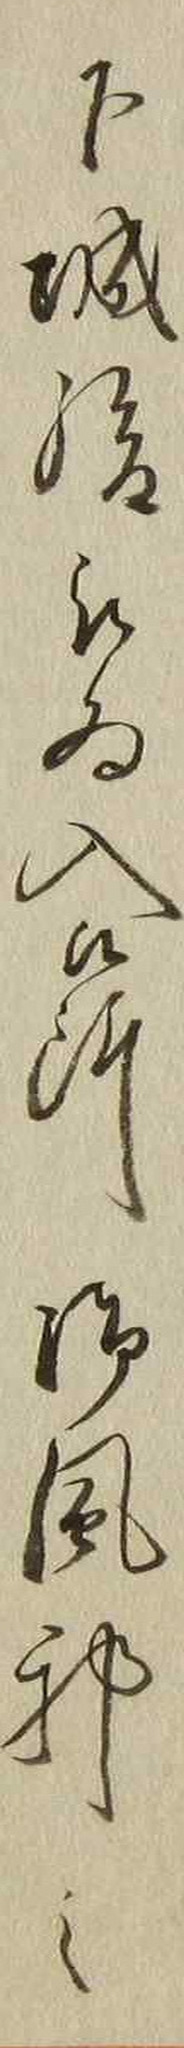下城後被為入候所御風邪之
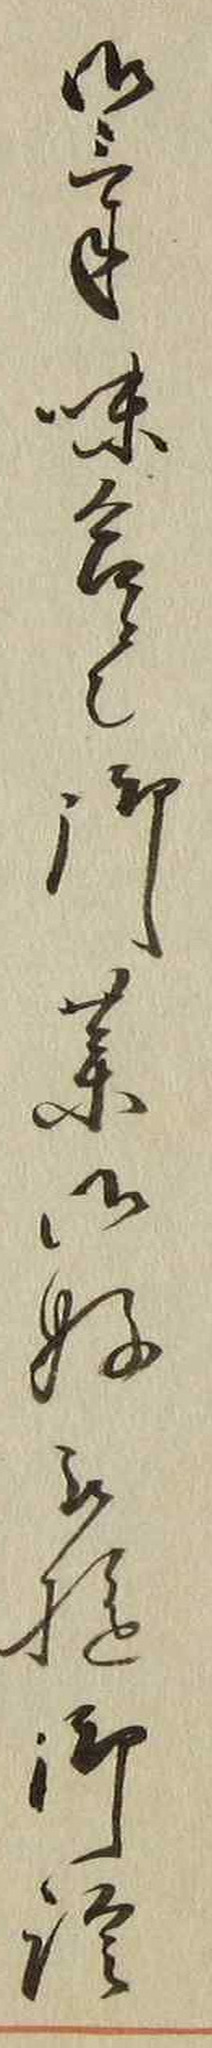御気味合ニて御薬御好被遊御診
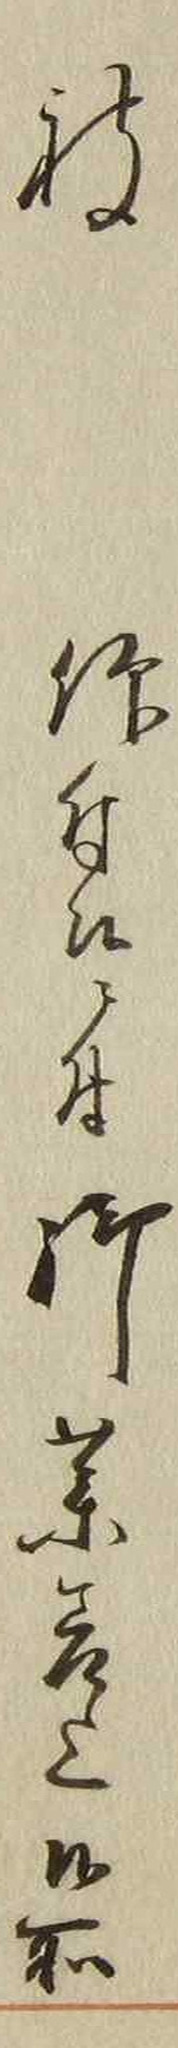被仰付候ニ付御薬差上候所
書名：諸士系譜　巻之68　を之部2
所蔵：会津若松市立会津図書館
